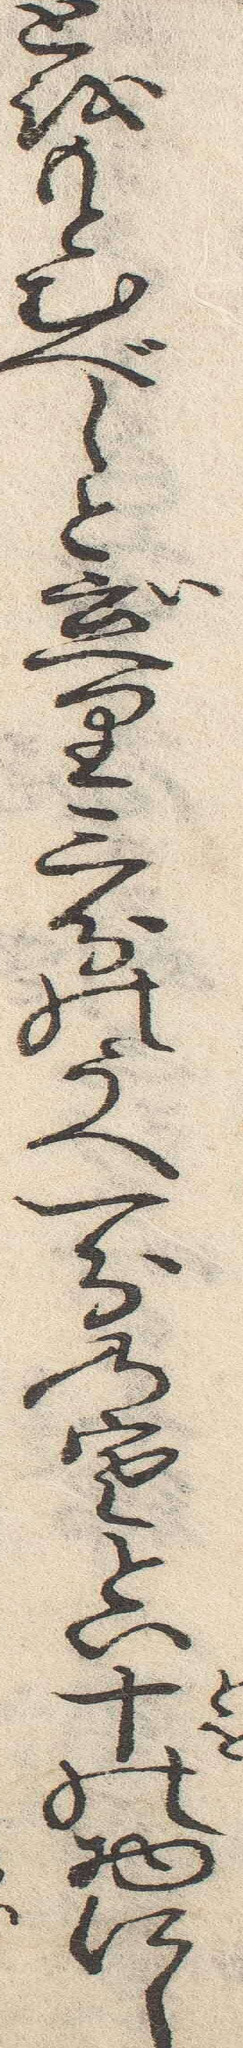とをもとむべしと云へり三分のうへ一分の寒とは十の物にし
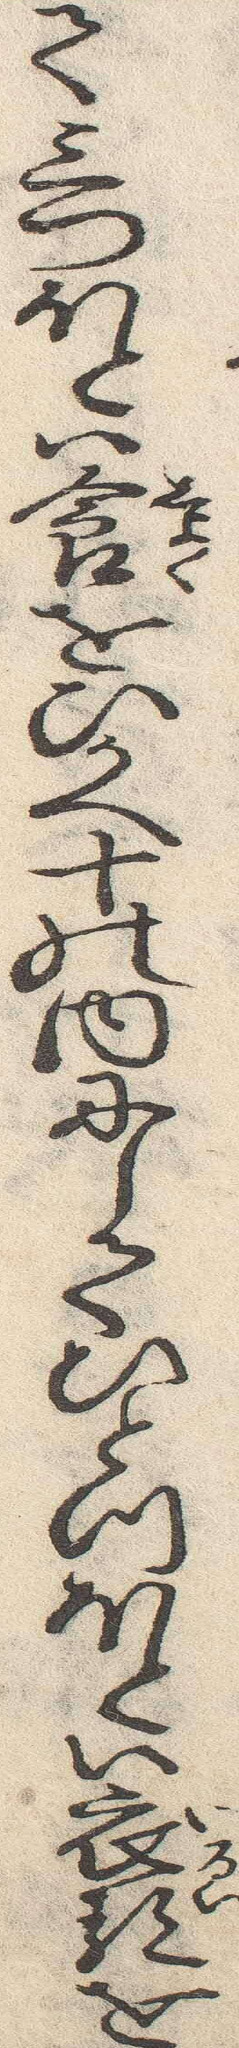て三つほとは食をひかへ十の内にしてひとつほとは衣類を
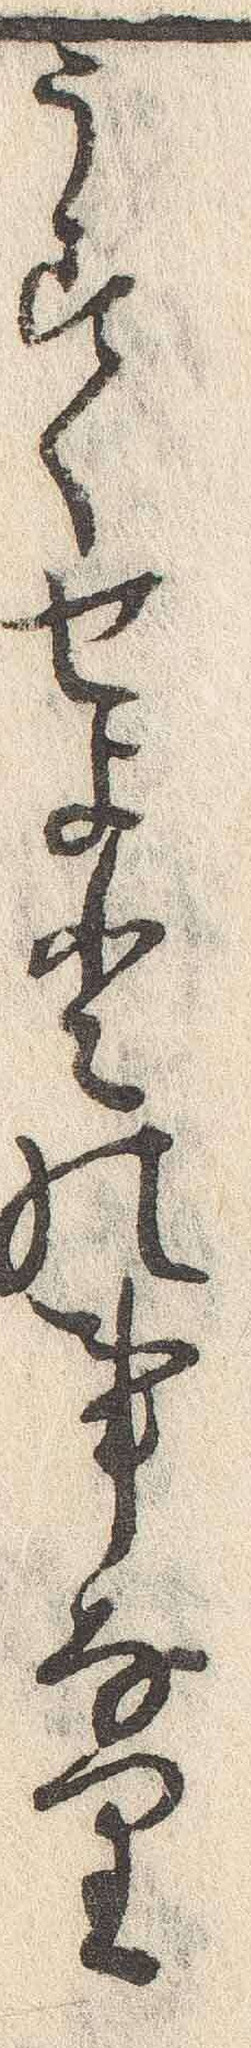うすくせよとの事なり
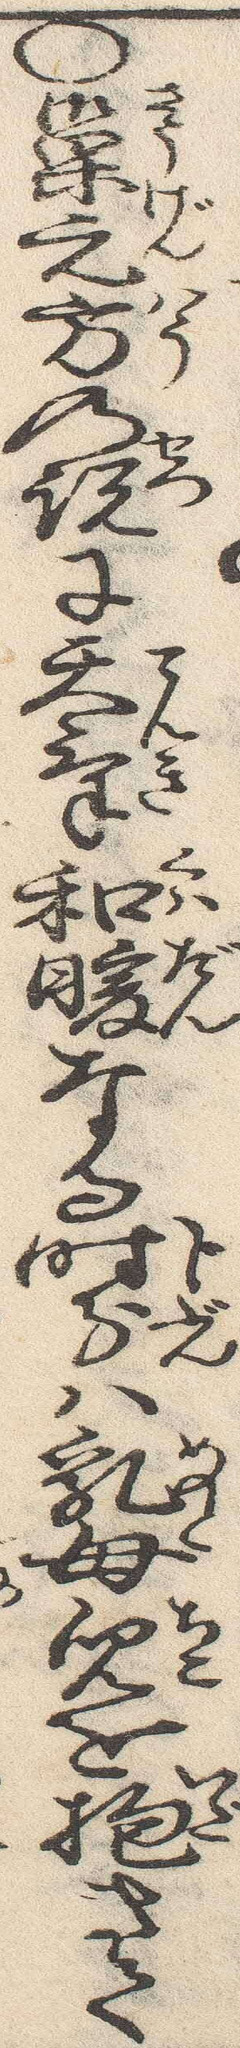◯巣元方の説に天氣和暖なる時分は乳母児を抱きて
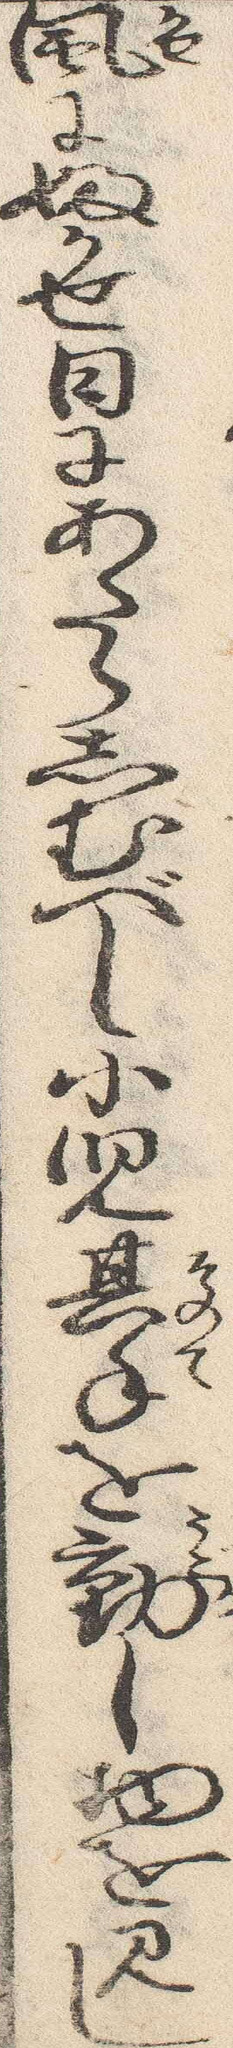風にふかせ日にあたらしむべし小児其手を動し物を見し
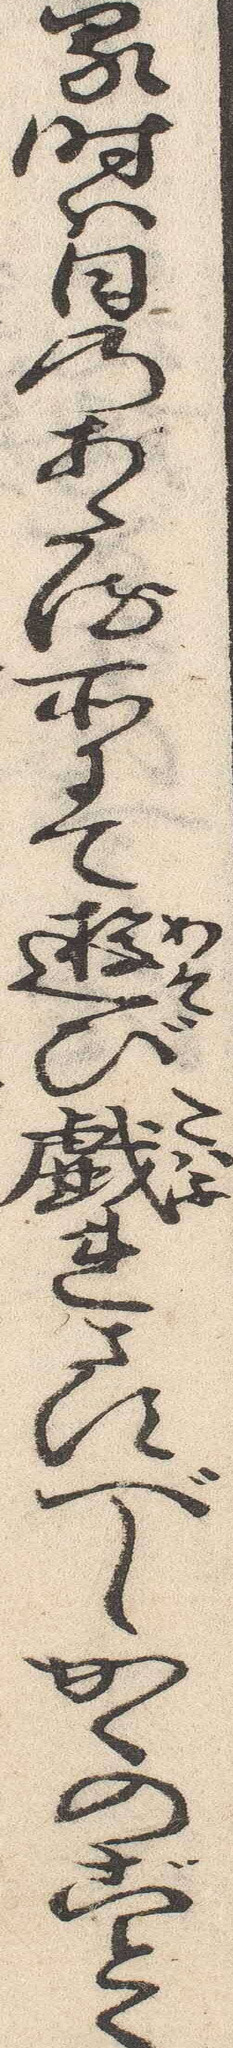る時は日のあたる所にて遊び戯れさすべしかくのごとく
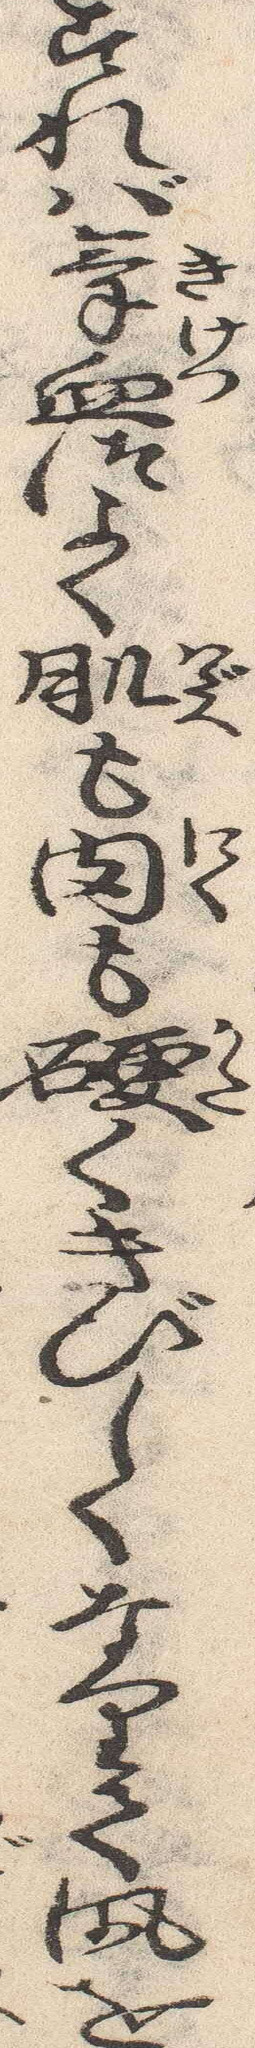すれば氣血つよく肌も肉も硬くきびしくなりて風を
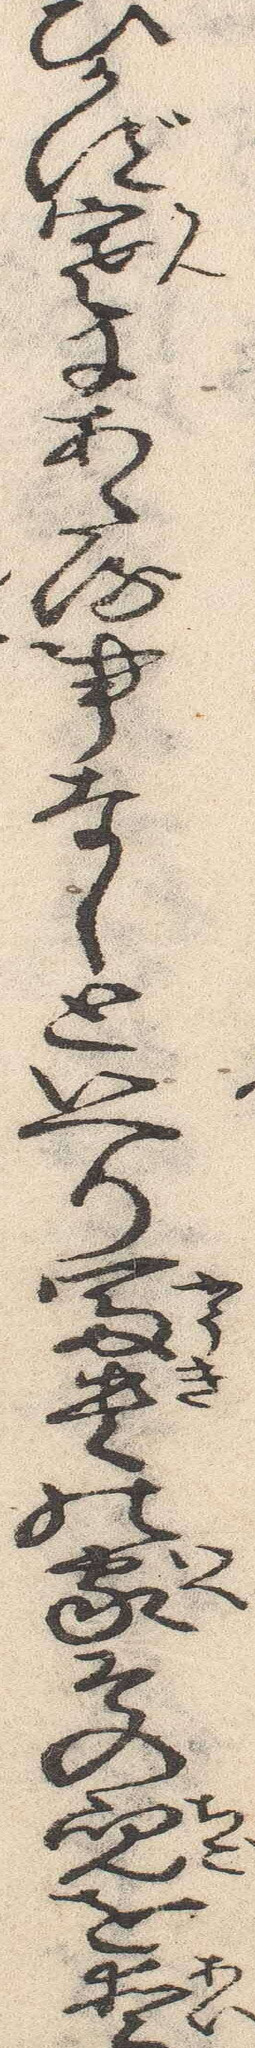ひかず寒にあたる事なしといへり富貴の家その児を愛
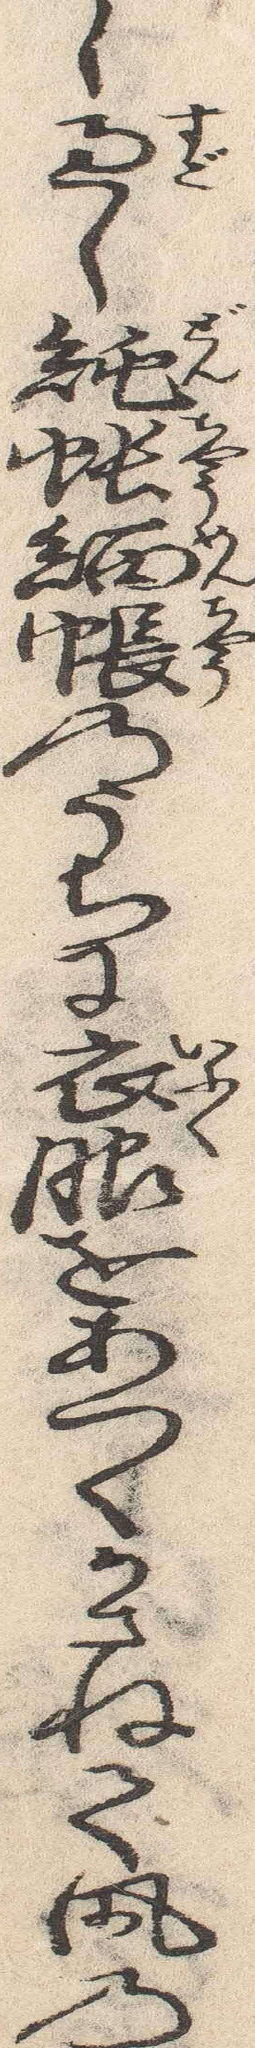し過し純帳緬帳のうちに衣服をあつくかさねて風の
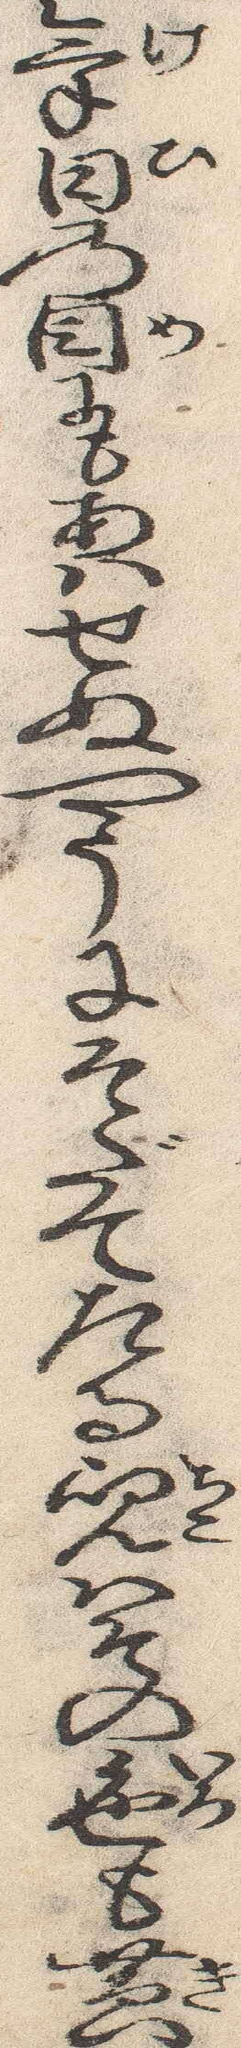氣日の目にもあはせぬやうにそだてたる児はその色も黄
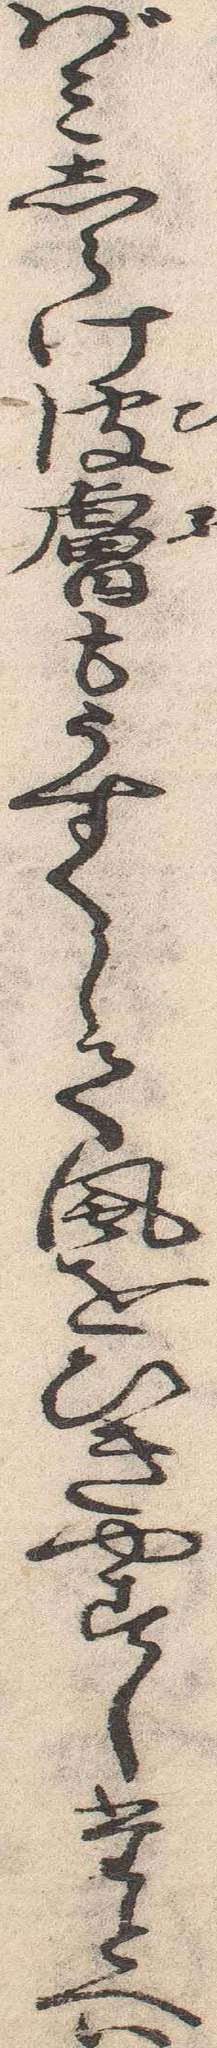ばみしらけ皮膚もうすくして風をひきやすしたとへは
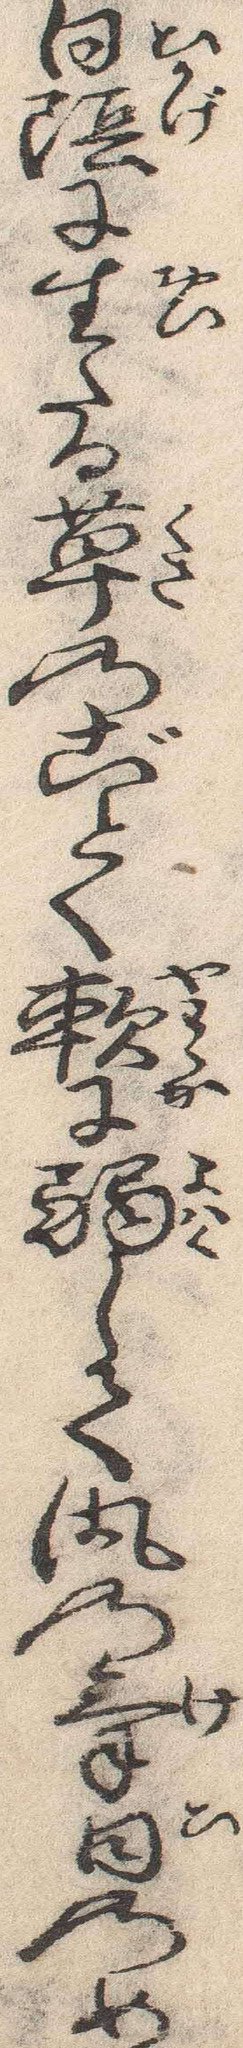日陰に生たる草のごとく軟に弱して風の氣日のめ
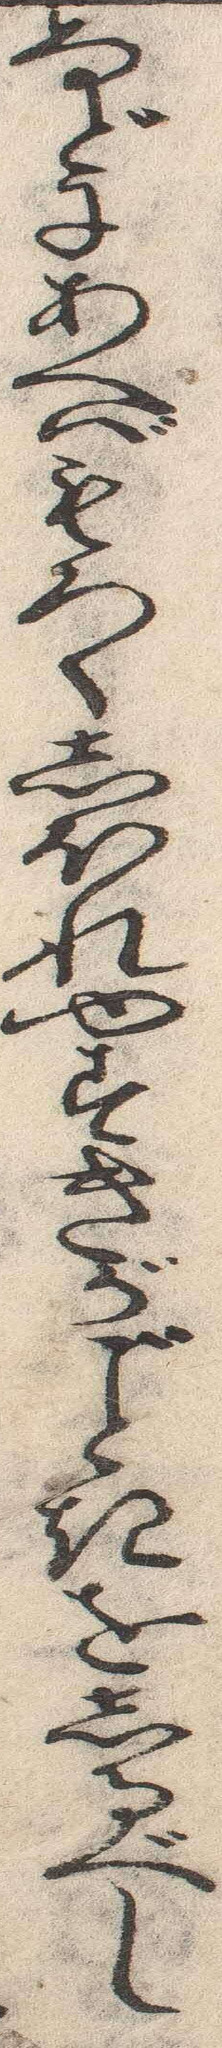などにあへばもろくしほれやすきがごときをしるべし
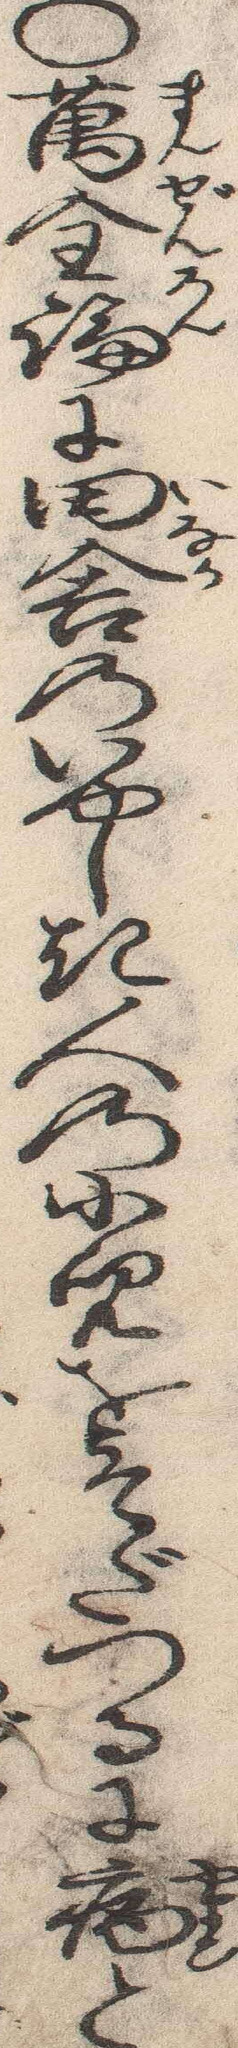◯萬全論に田舎のいやしき人の小児をそだつるに病と
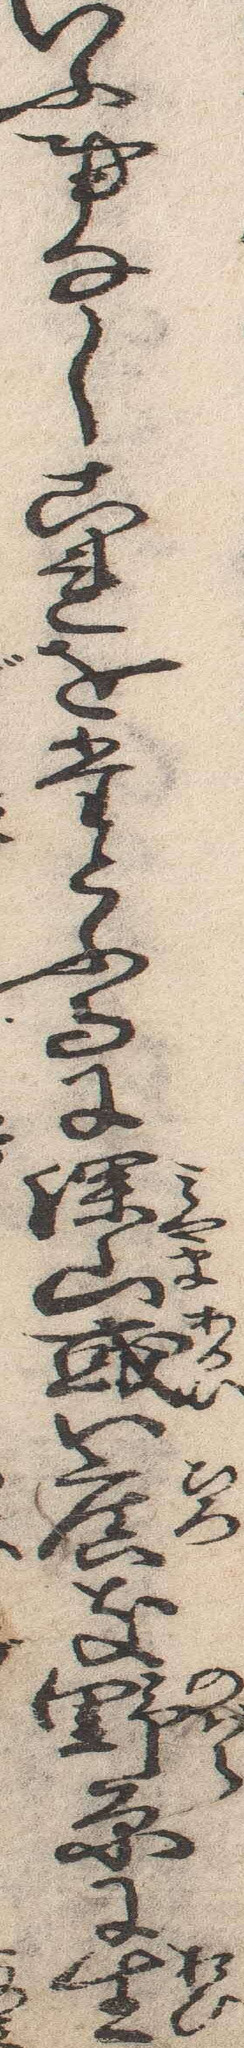いふ事なしこれをたとふるに深山或は廣き野原に生
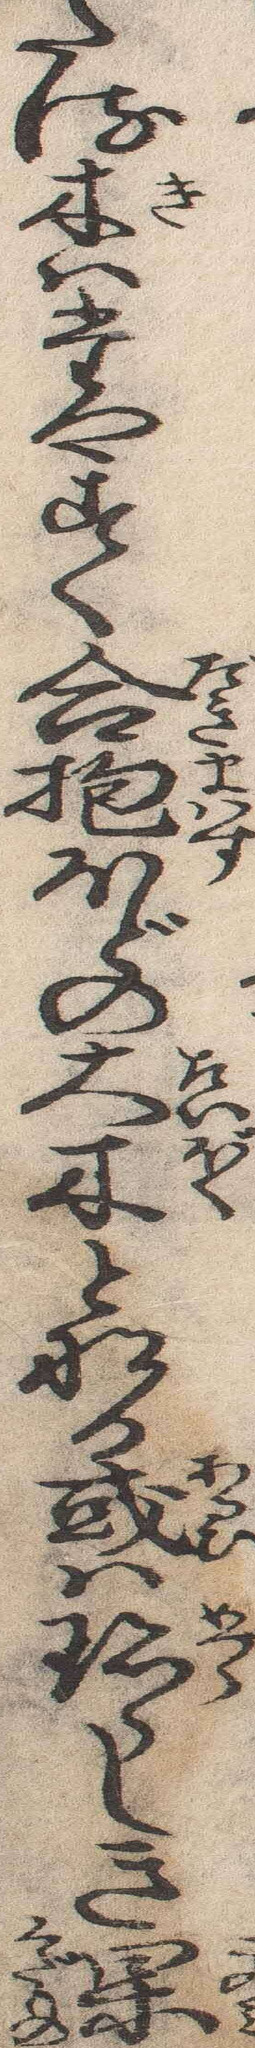たる木はたやすく合抱ほどの大木となり或は珍らしき果
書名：小児必用養育草
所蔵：東京学芸大学附属図書館 国文学研究資料館
